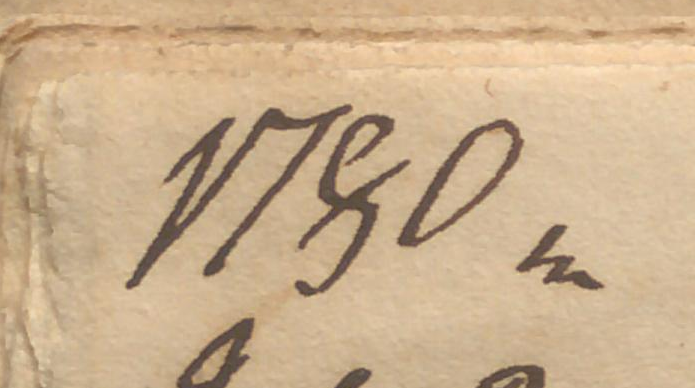1780
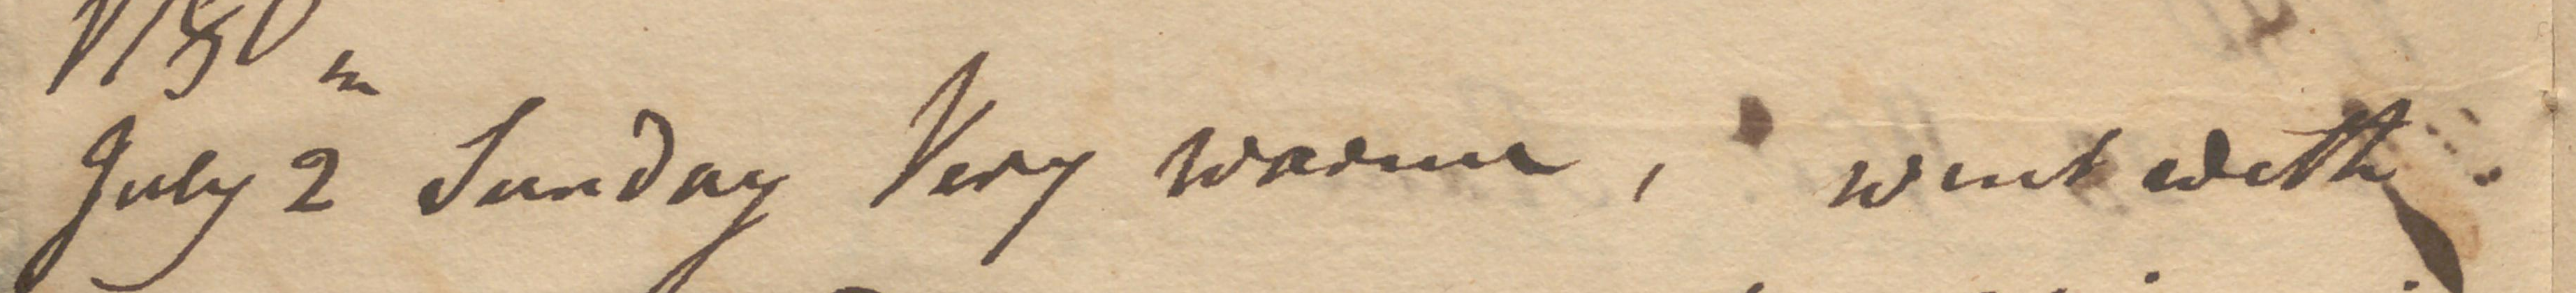July 2^th Sunday Very warme, went with
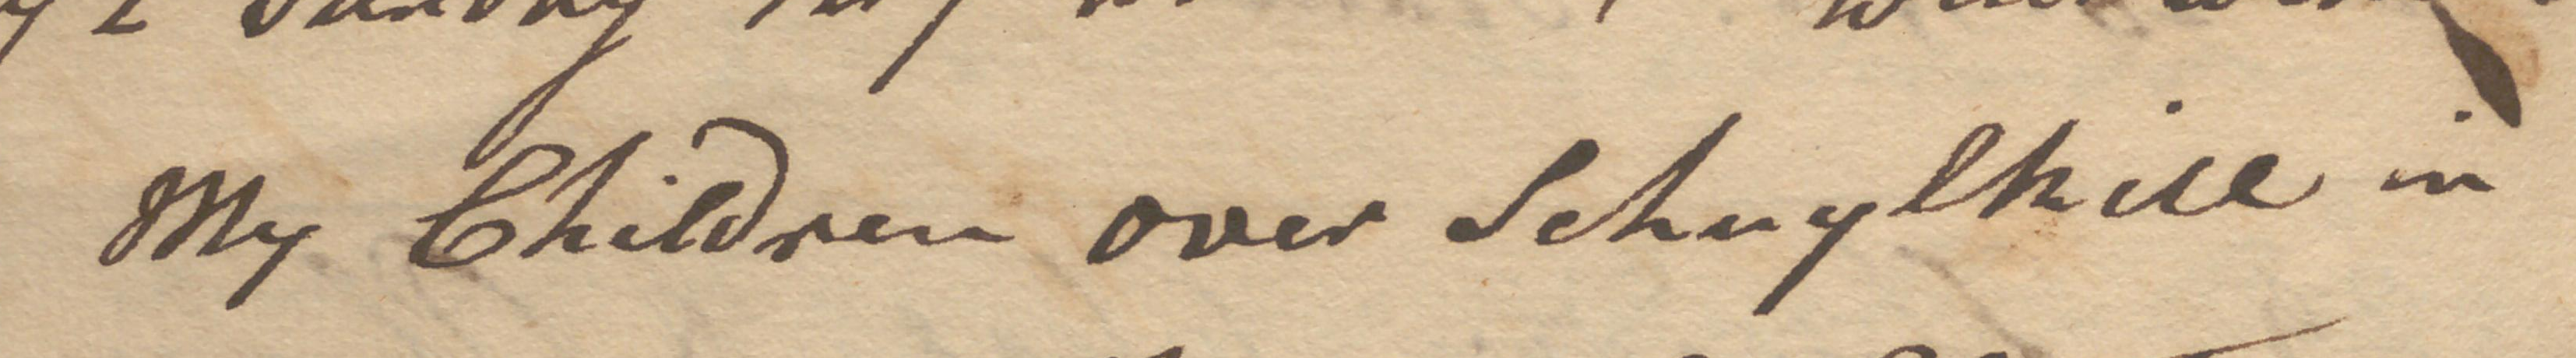My Children over Schuylkill in
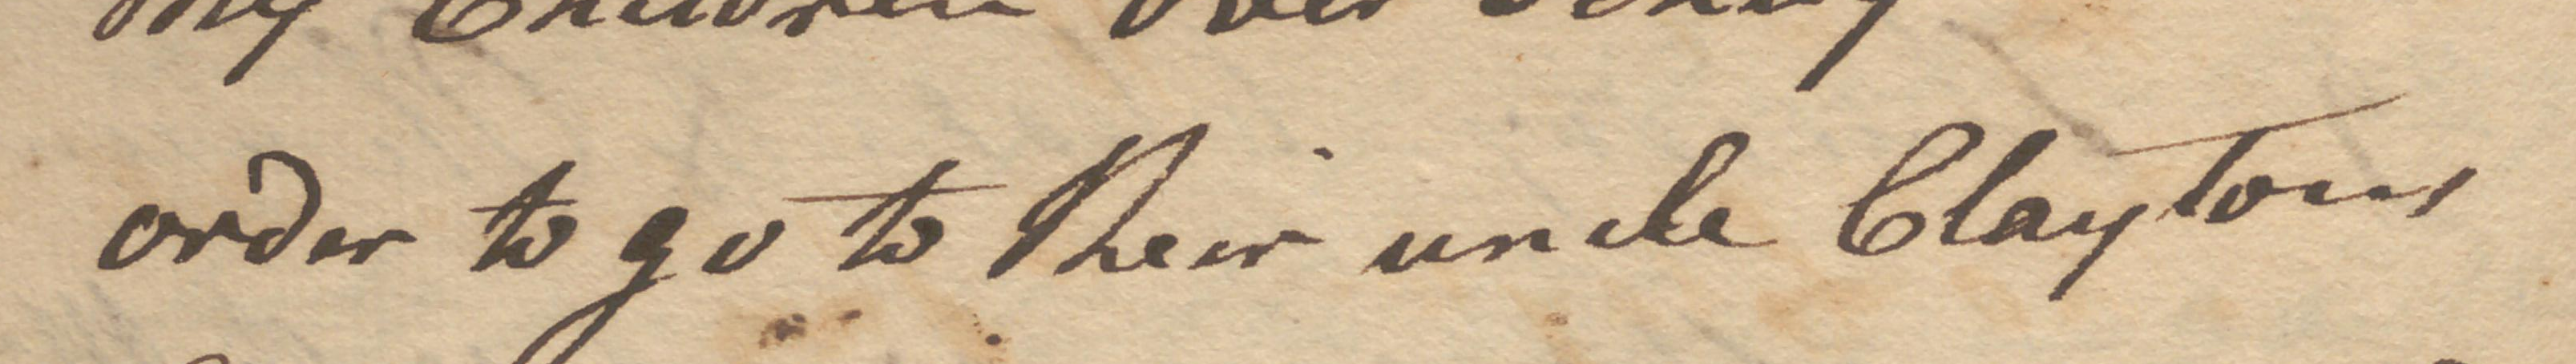order to go to their uncle, Claytons
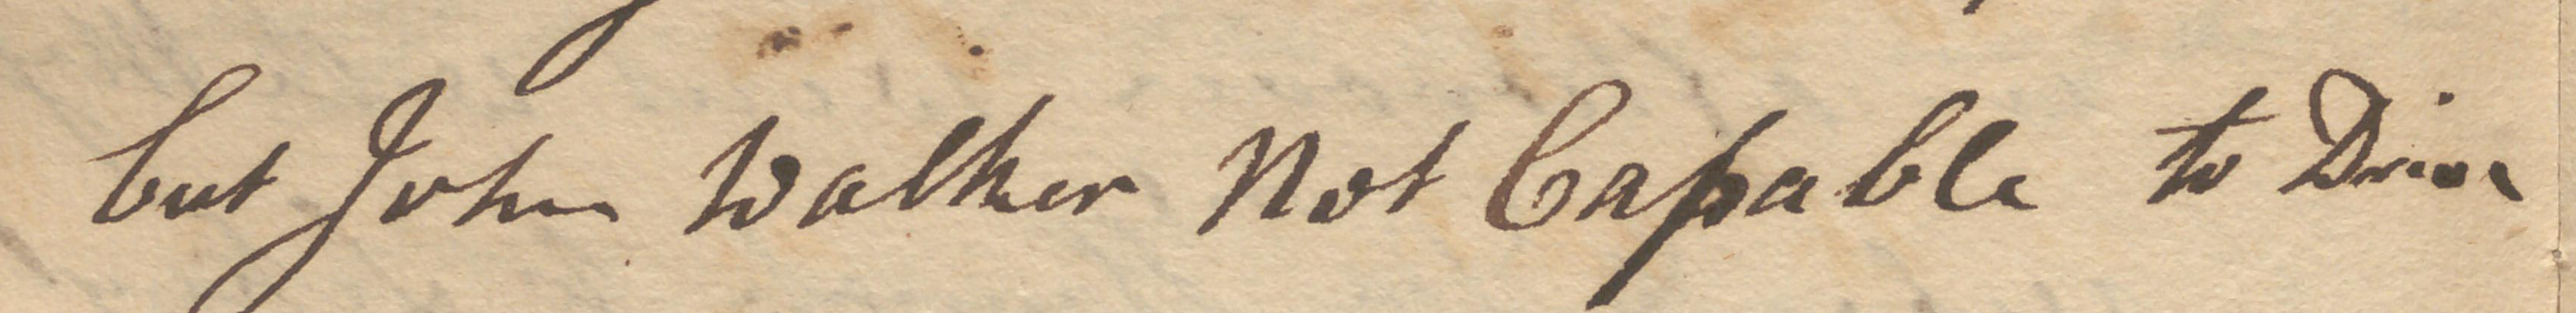but John Walker Not Capable to Drive
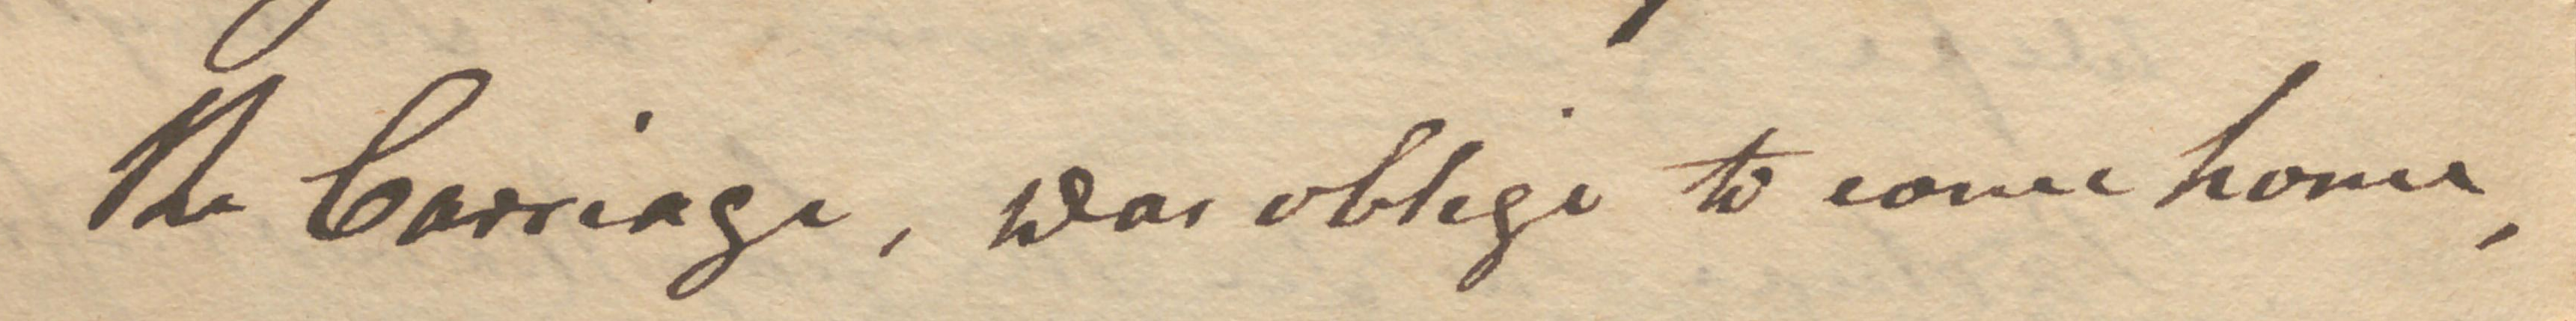the Carriage, was oblige to come home
